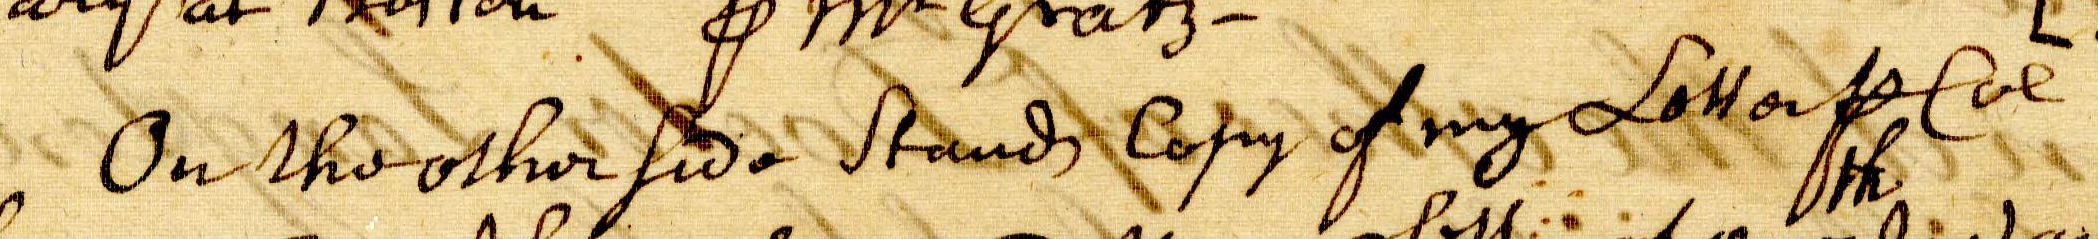On the other side stands Copy of my Letter per Col
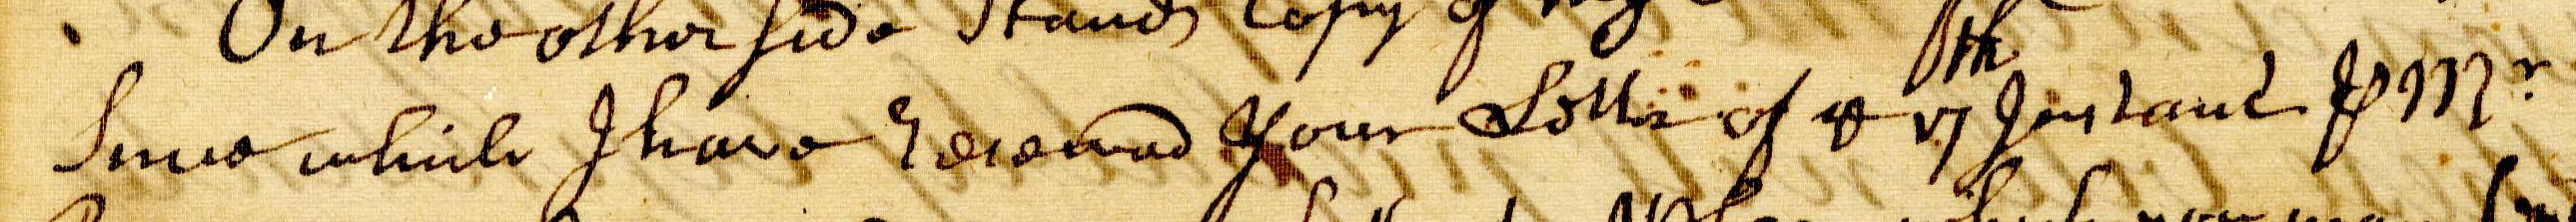{Sm_} which I have received Your Letter of 7^th y^e 17^th Instance per M^r.
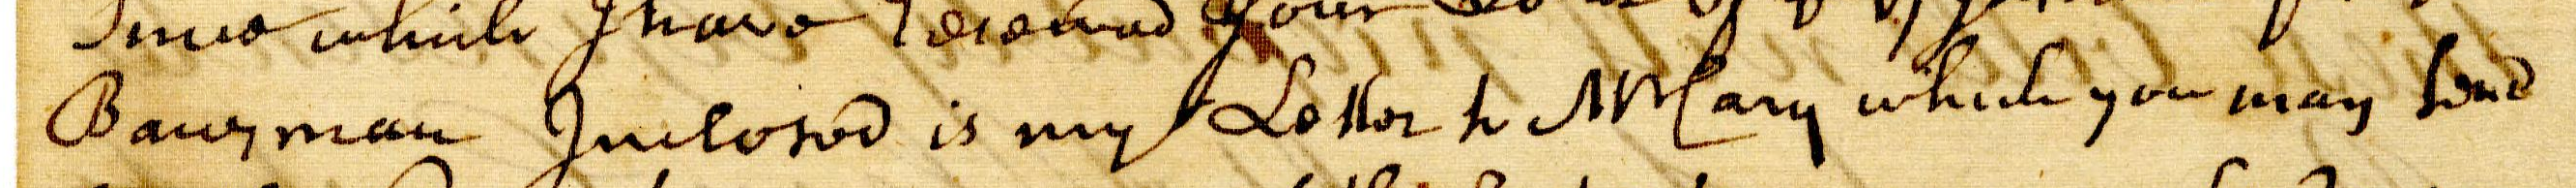Baurman Inclosed is my Letter t M^r Cary which you may send
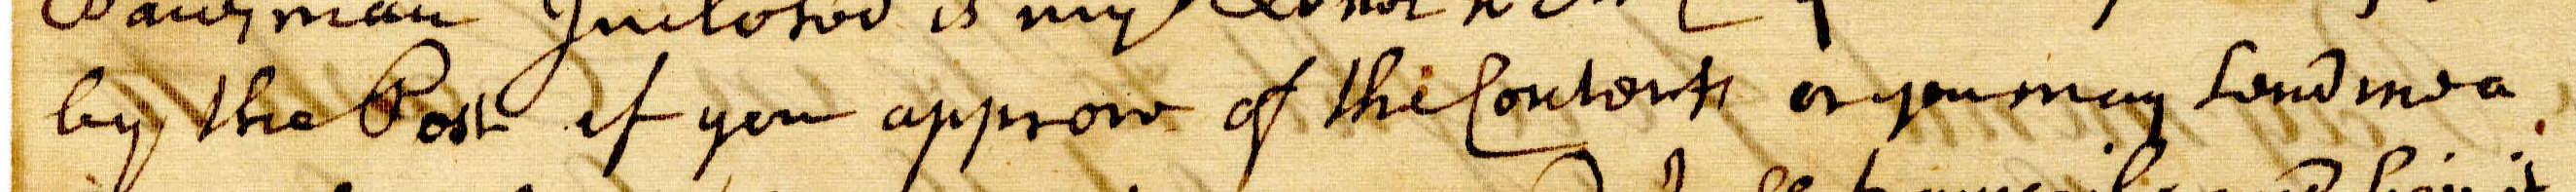by the Post if you approve of the Contents or you may send me a
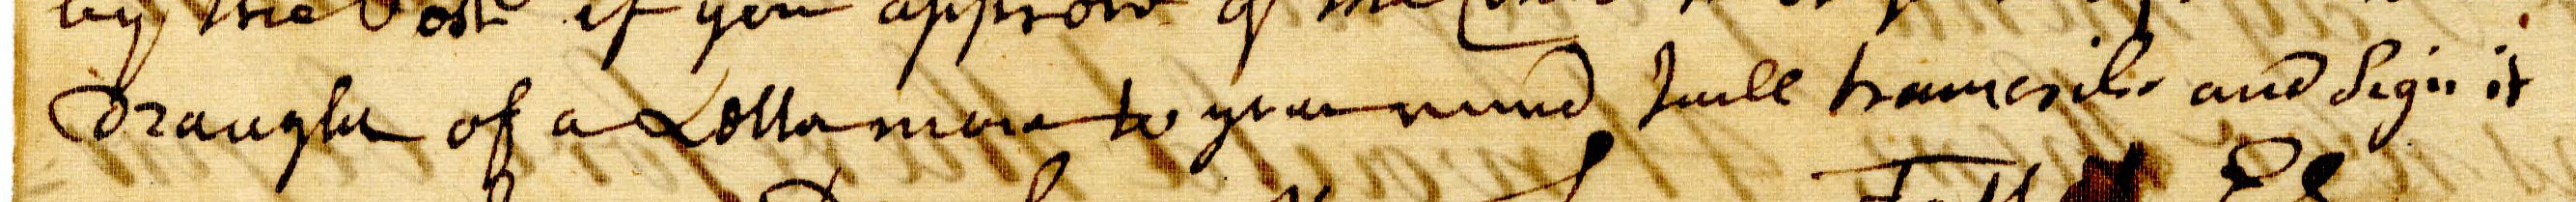draught of a Letter more to your mind I will transmit and Sign it
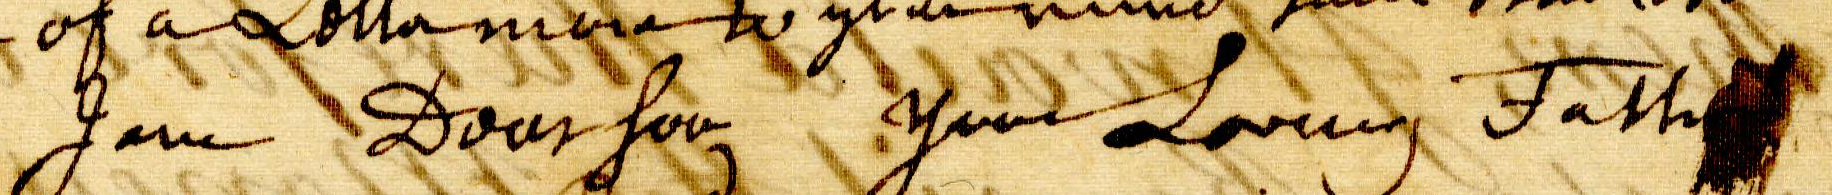I am Dear Son Your Loving Father
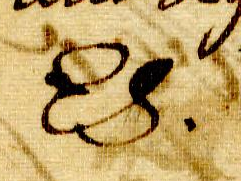ES.
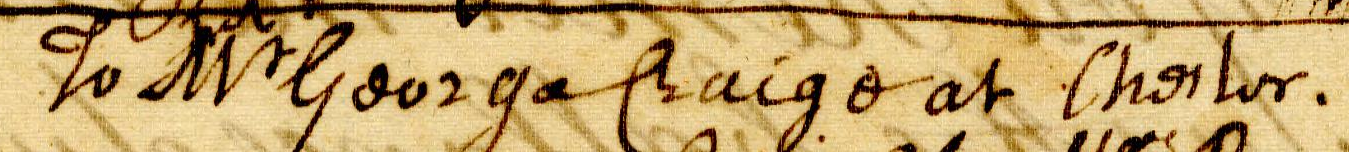to M^r George Craige at Chester
